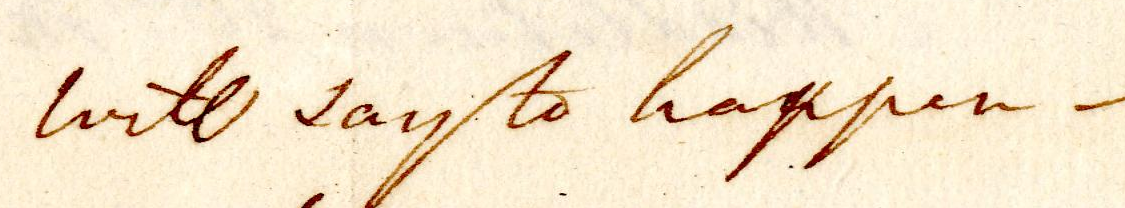will say to happen.
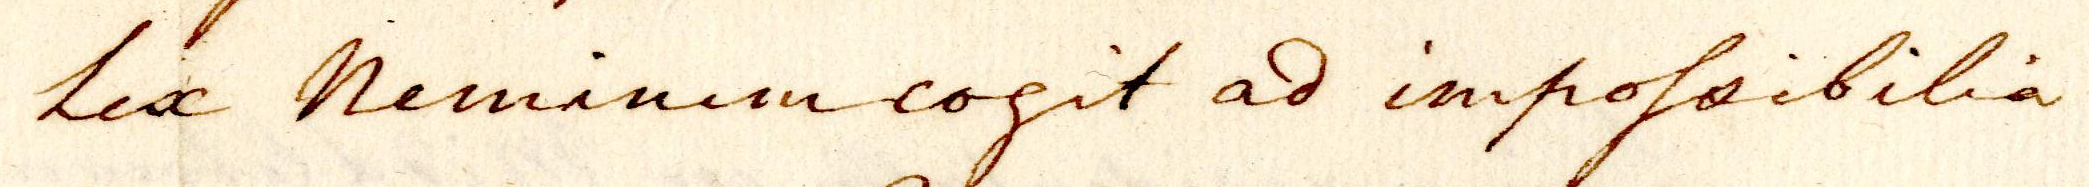Lex Neminem cogit ad impossibilia
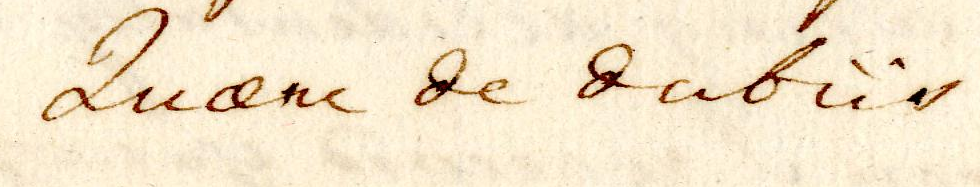Quaere de dabiis
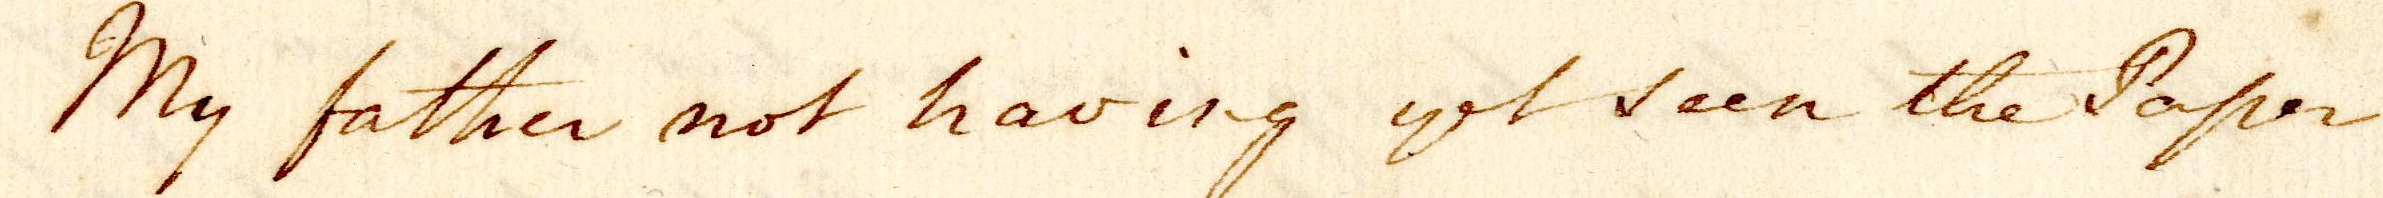My father not having yet seen the Paper
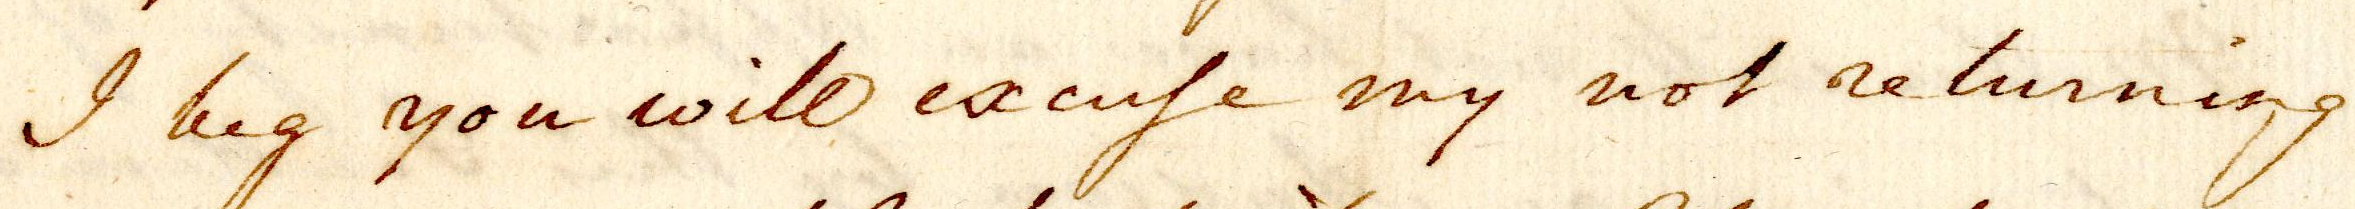I beg you will excuse my not returning
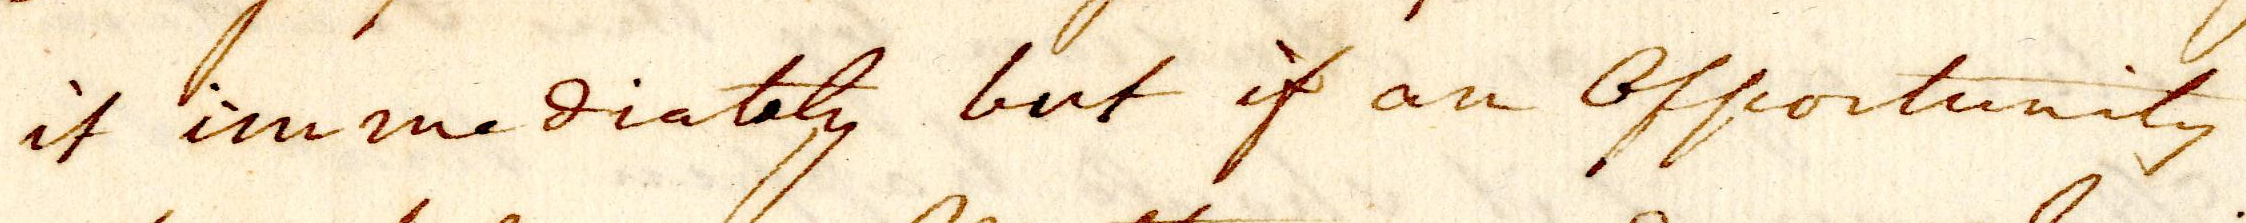it immediately but if an Opportunity
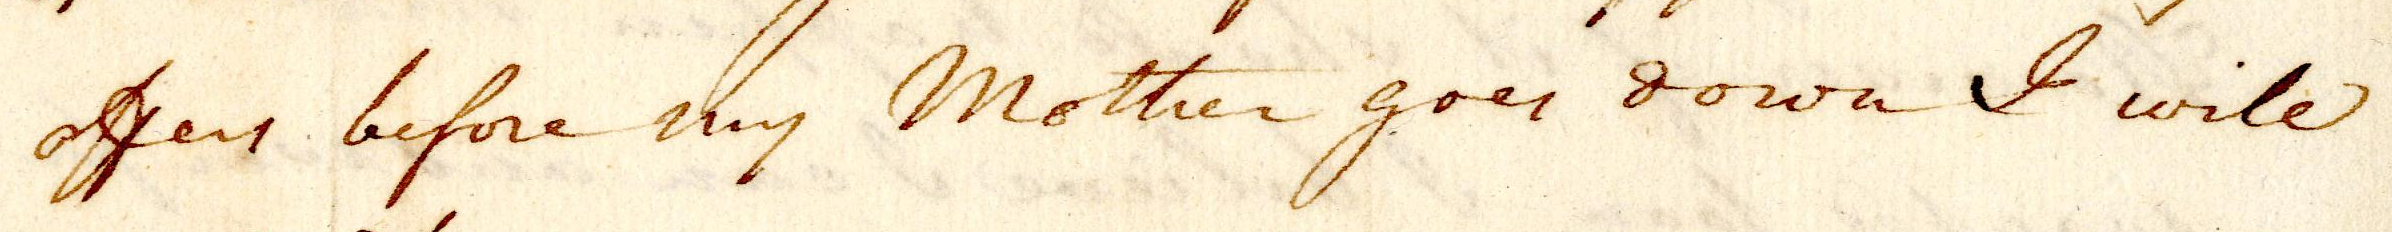offers before my Mother goes down I will
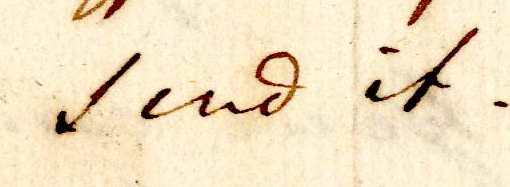send it.
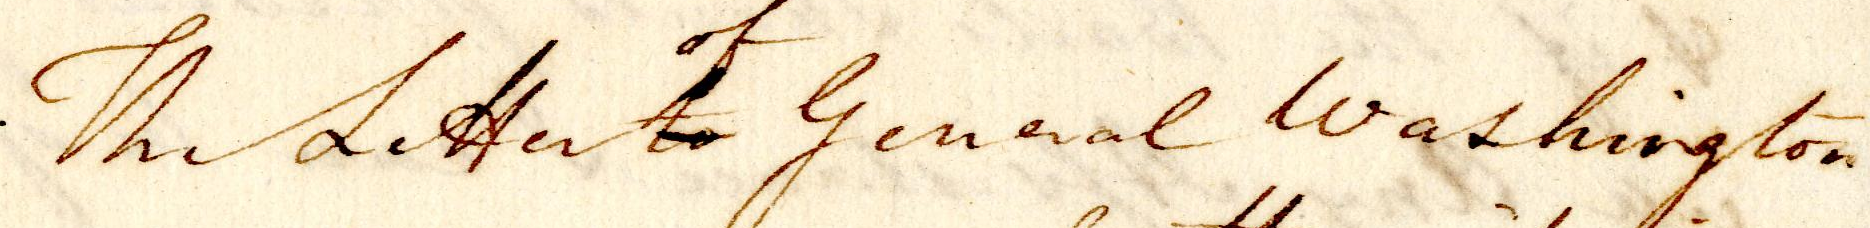The Letter to General Washington
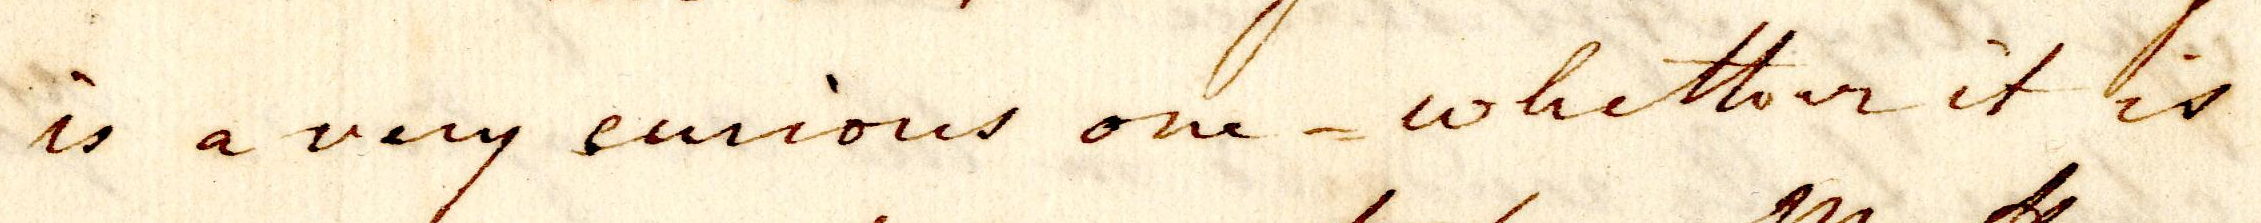is a very curious one, whether it is
